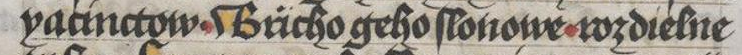yacínctow.Bṙicho geho ſlonowe.rozdielne
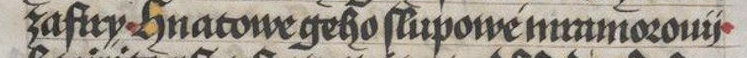zafiry.Hnatowe geho ſlupowé mramorouij.
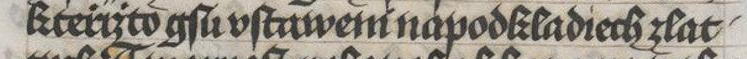kteṙíżto gſú vſtaweni napodkladiech zlat¬
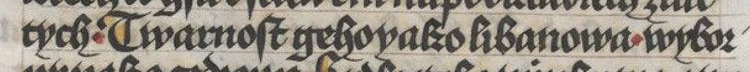tych.Twarnoſt geho yako libanowa.wybor¬
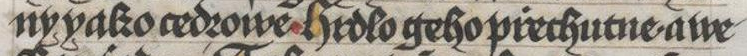ný yako cedrowé.Hrdlo geho pṙechutne.a we¬
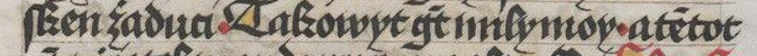ſken żaducí.Takowyt ḡt mily moy.a tētot
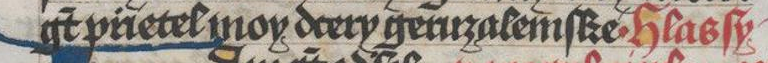ḡt pṙíetel moy dcery geruzalemſké.Hlas ſy¬
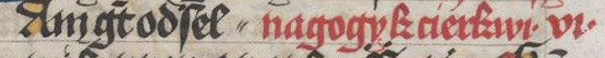Ani ḡt odẛel nagogy k cíerkwi. vi.
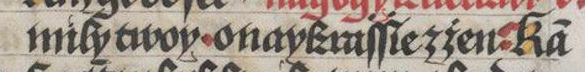mily twoy. o nyakraẛẛie z żen: Kā
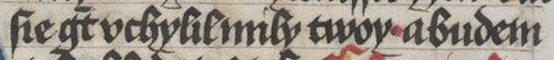ſie ḡt vchylil mily twoy.a budem
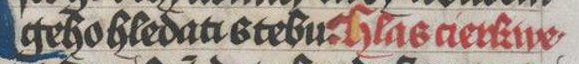geho hledati s tebu? Hlas cíerkwe
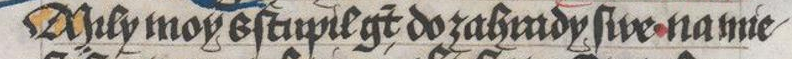Mily moy sſtupil ḡt do zahrady ſwe.na mie¬
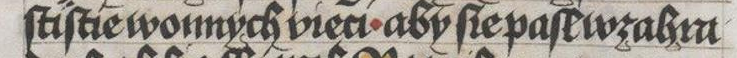ſtiẛtíe wonnych viecí.aby ſie paſl w zahra¬
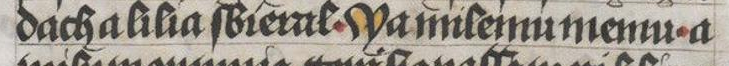dach a lilia ſbieral.Ya milemu memu. a
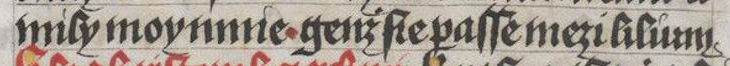mily moy mnie. genż ſie paſſe mezi lilium
